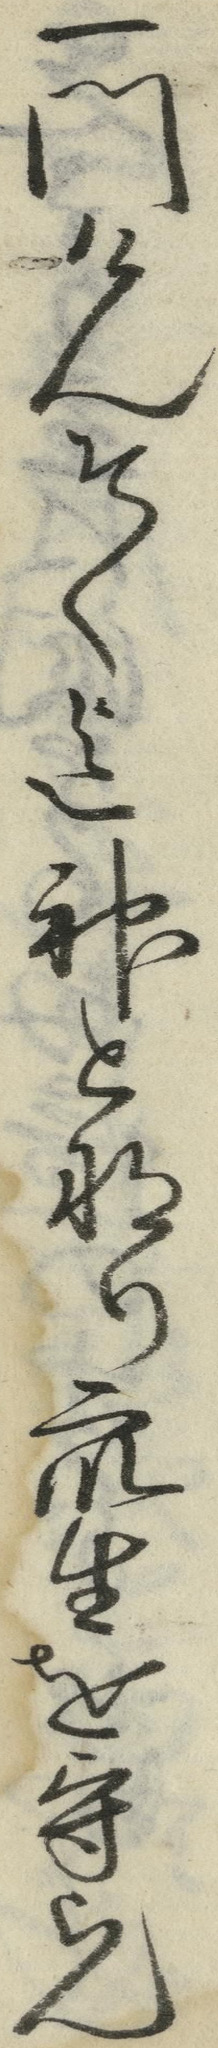一門けんそく迄神となり衆生を守らん
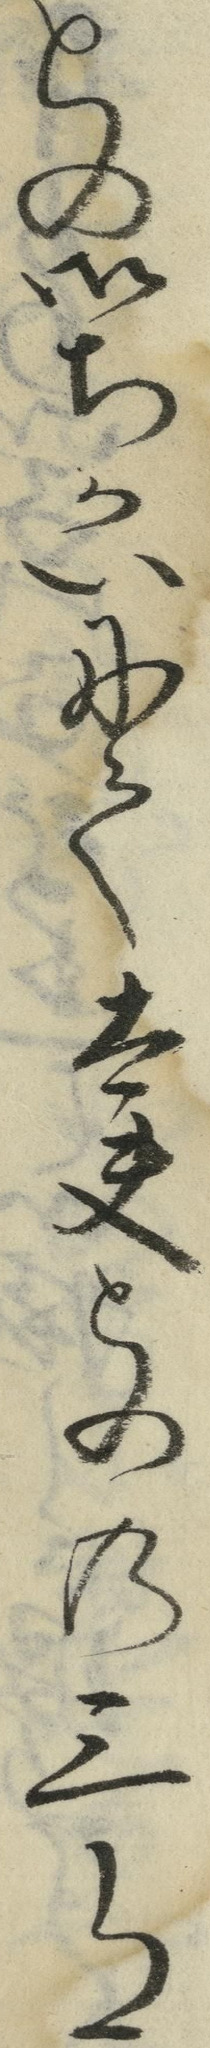との御ちかいにて太夫とのの三月
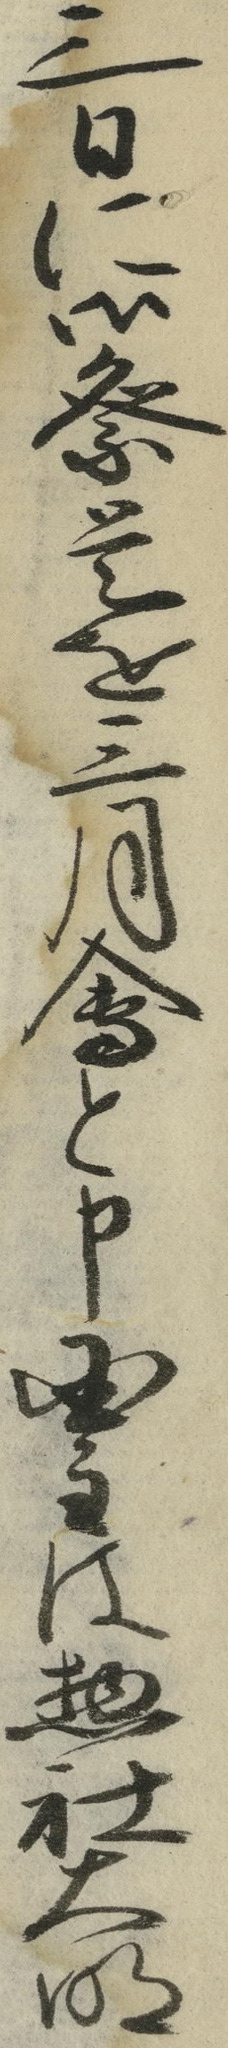三日に御祭是を三月會と申国主は惣社大明
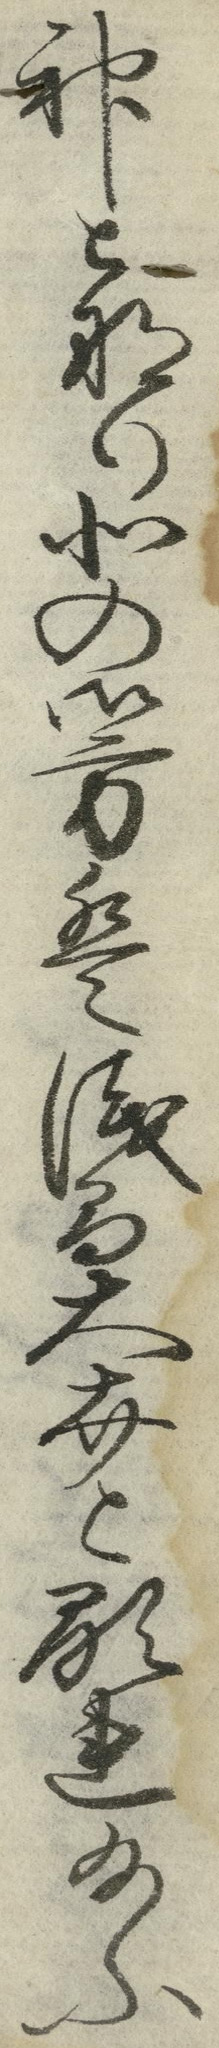神となり北の御方は浅間大菩薩と顕れ給ふ
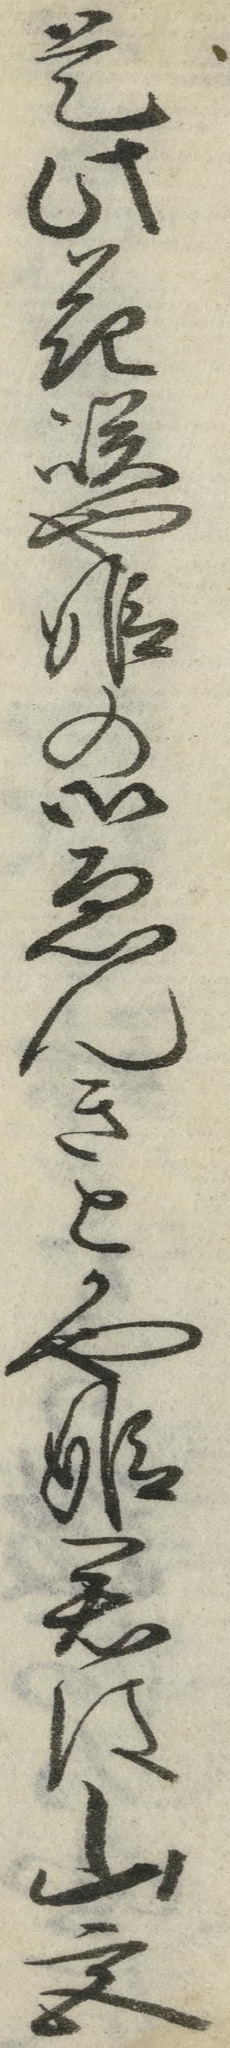是此花咲や姫の御ゑんきとかや姫君は山宮
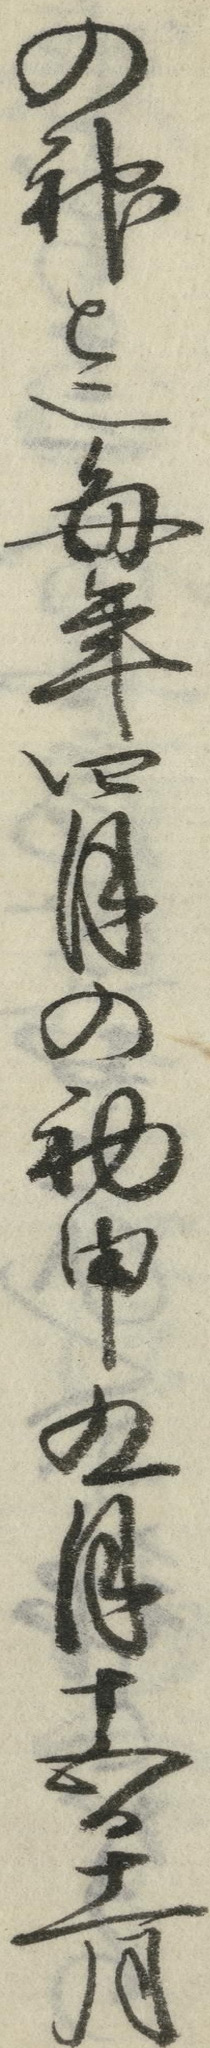の神と也毎年四月の初申九月十五日十一月
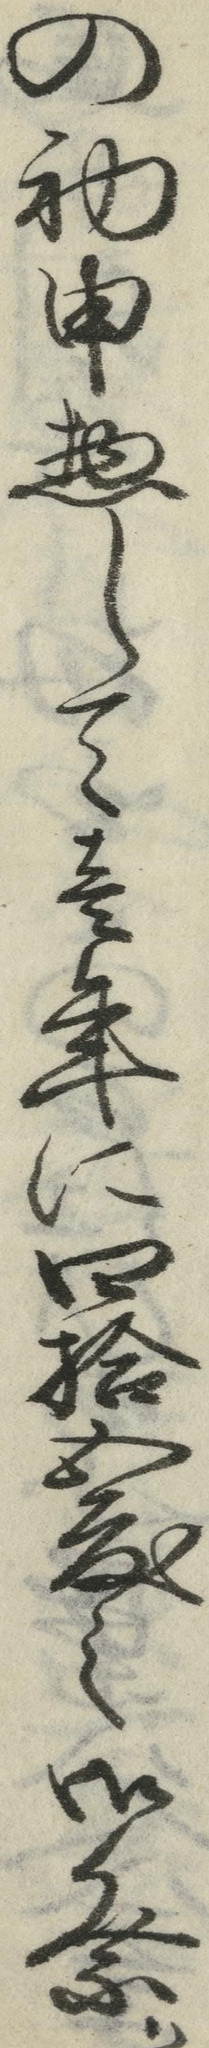の初申惣して壱年に四拾五度之御祭リ
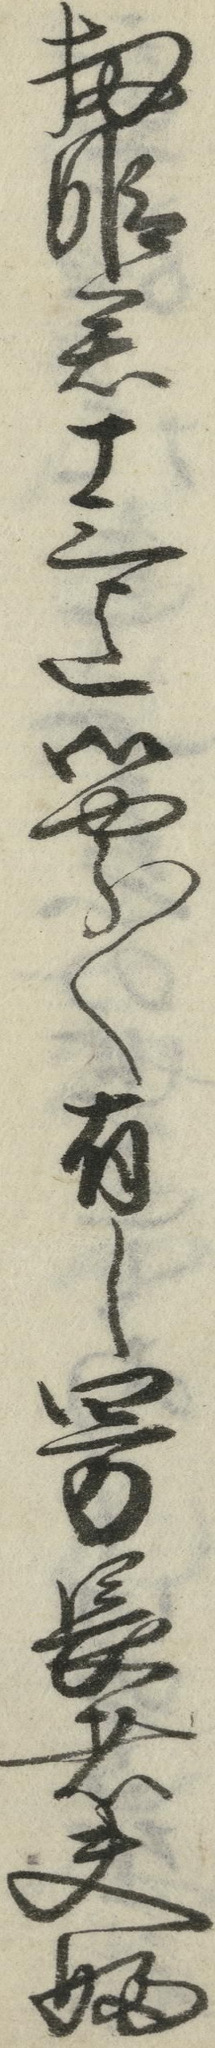扨姫君十三迄御やう〳〵有し四万長者夫婦
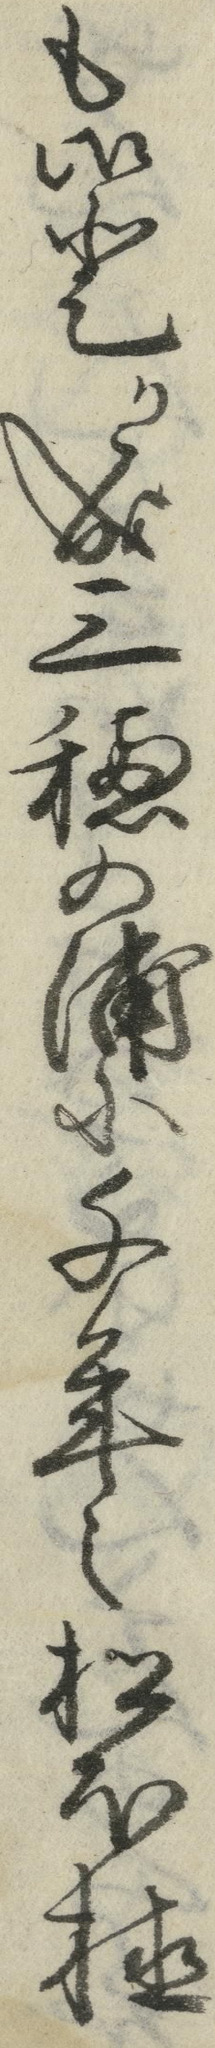も御登り成三穂の浦に千年之松ほ植
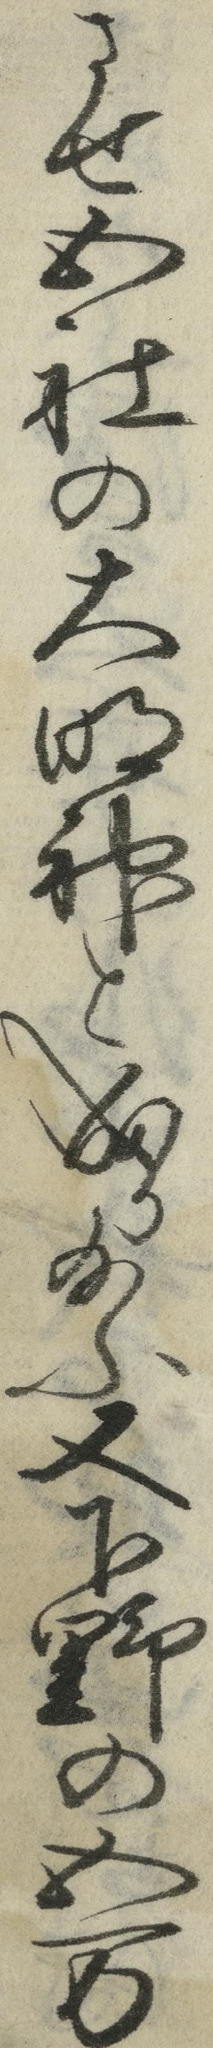させ五社の大明神と成り給ふ又下野の五万
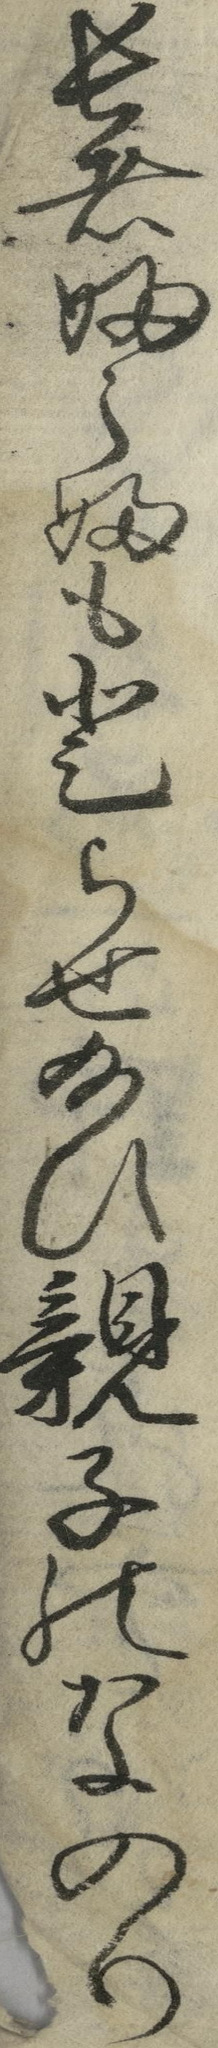長者ふうふも登らせ給ひ親子のなのり

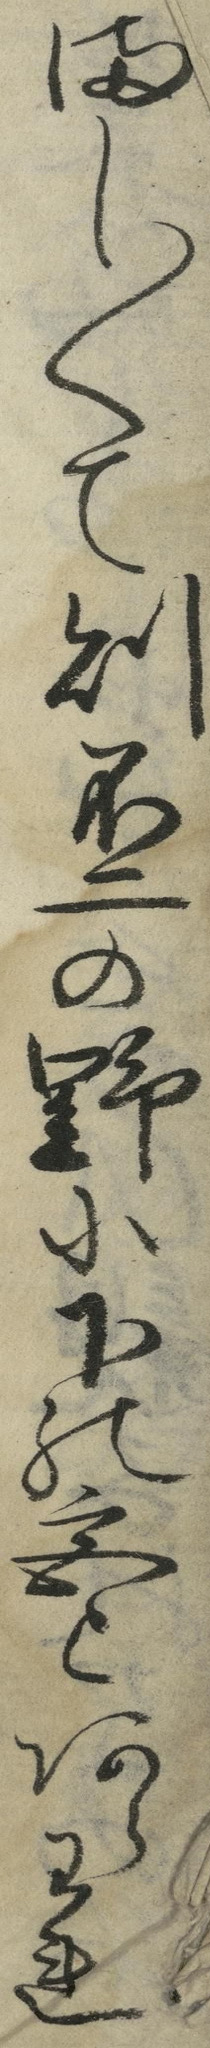まし〳〵て則不二の野に下の宮とあらわれ
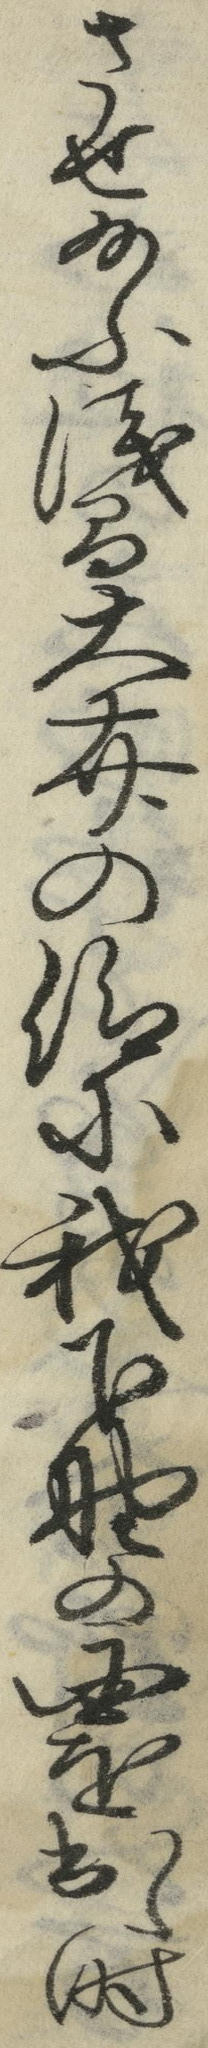させ給ふ浅間大菩薩の仰に我下野の国を出し時
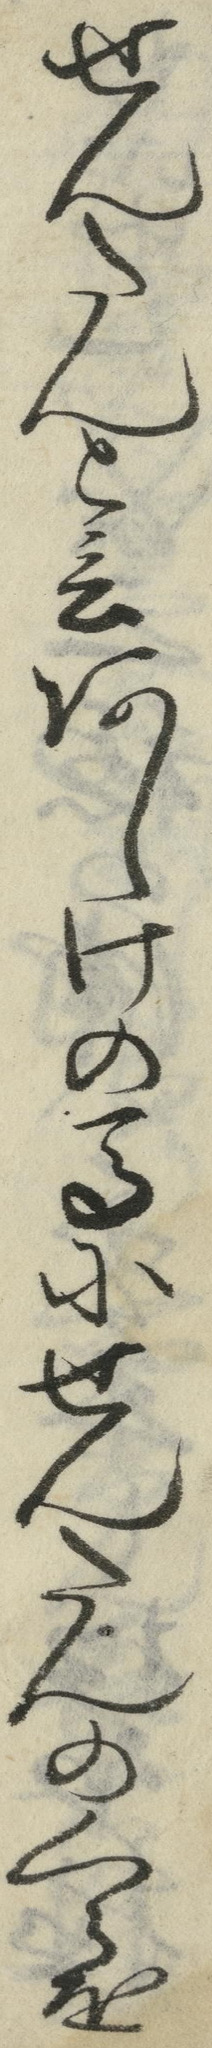せんたんと言あしけの馬にせんたんのくらを
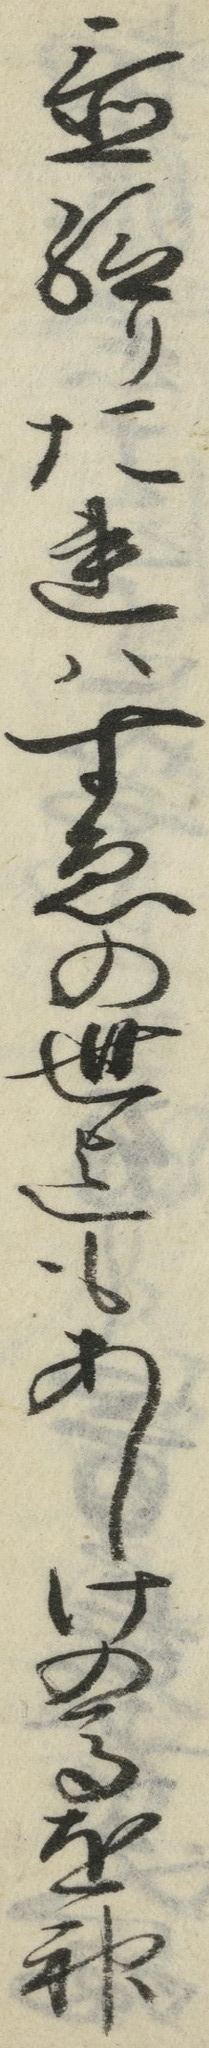置給りたれハすゑの世迄もあしけの馬を神
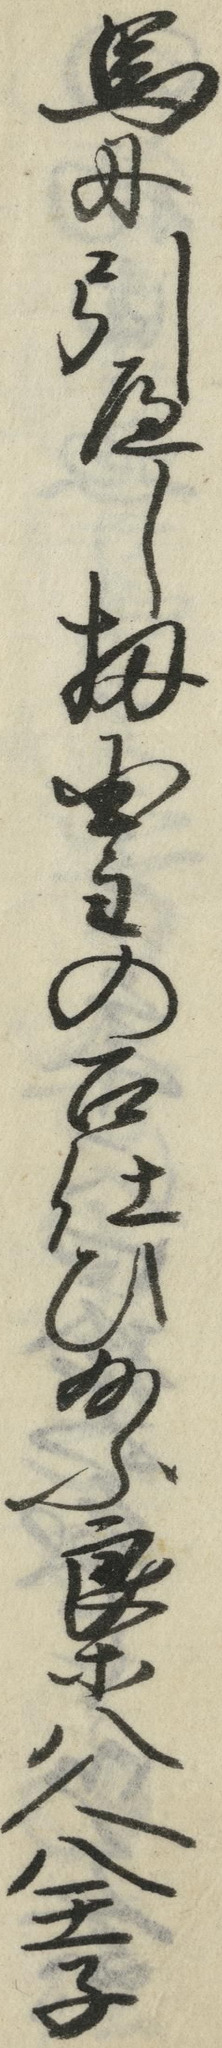馬に引へし扨国主の召仕ひ給ふ良等八人八王子
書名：浅間記
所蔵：東京大学地震研究所図書室 Earthquake Research Institute Library, The University of Tokyo, JAPAN
